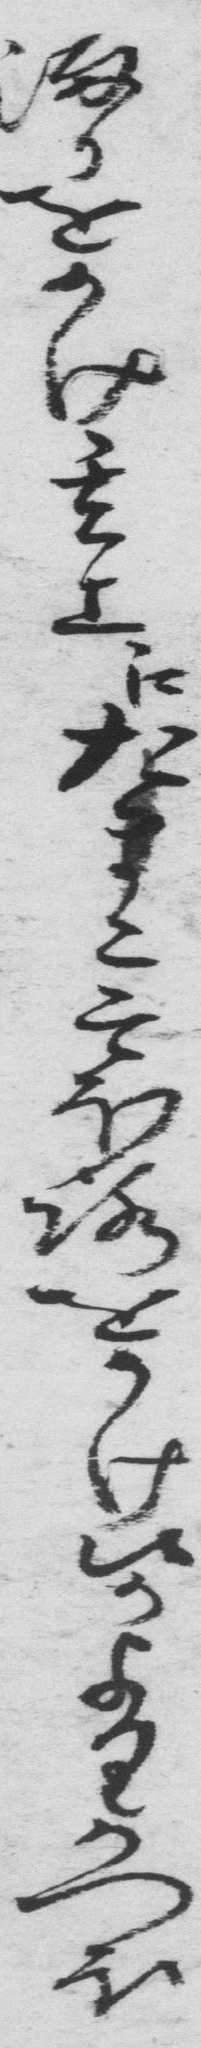溜りをかけ其上えたまこそほろをかけ候かよりかつほ
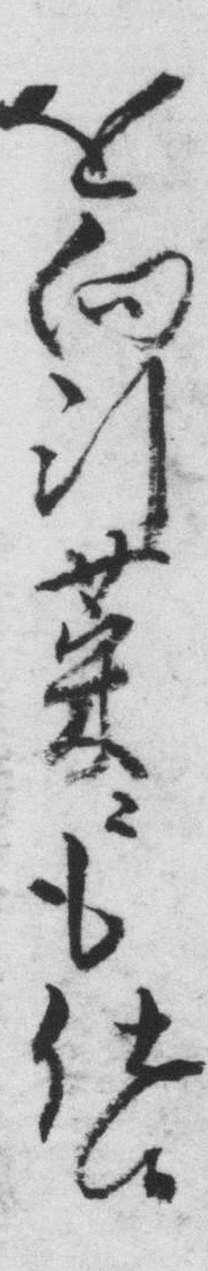を向引菜にも仕候
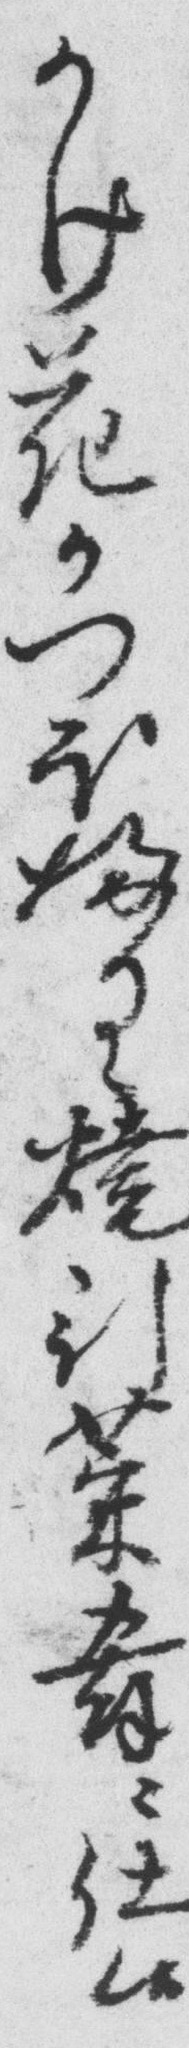かけ花かつほふり焼引菜肴に仕候
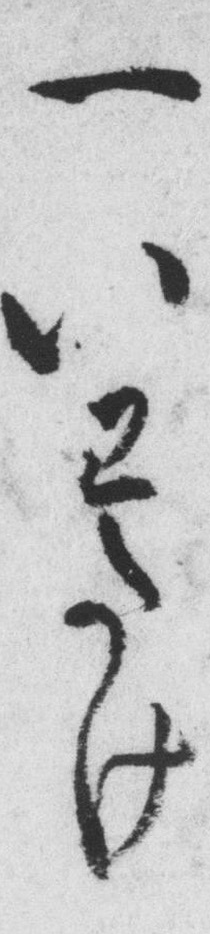一いわたけ
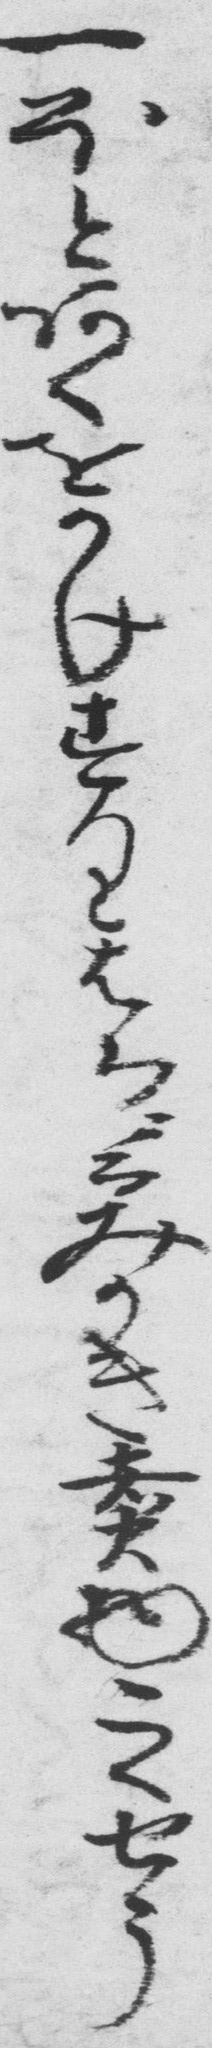一ほとあくをかけすりこはちにてみかき煮物こくせう
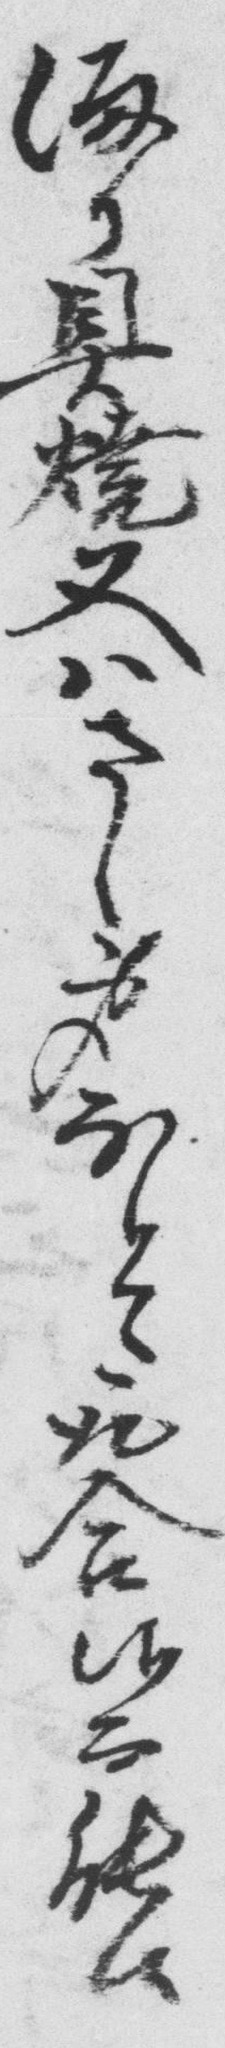溜り貝焼又はさし身なそ取合能候
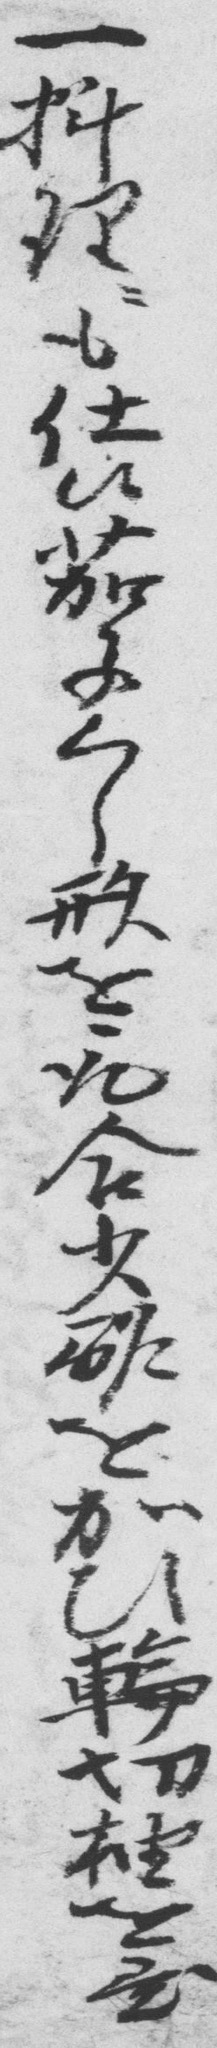一料理にも仕候茄子くし形を取合少酢を加ひ輪切柚を置
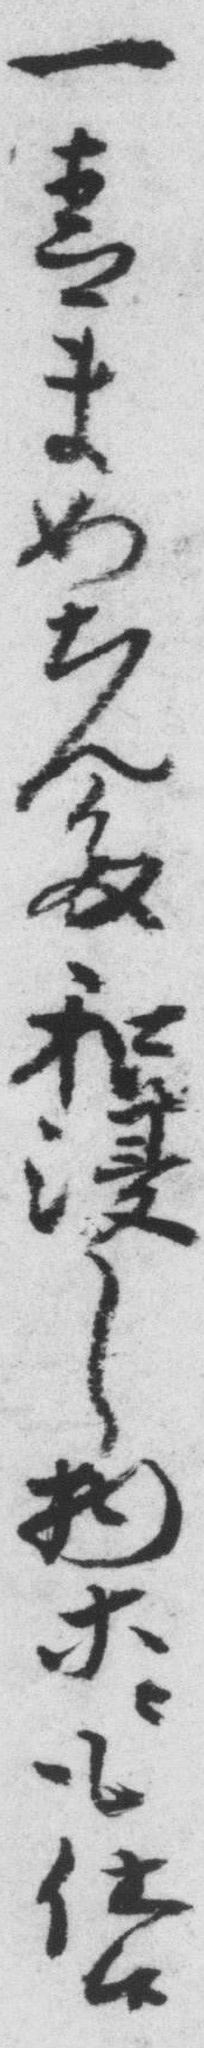一青まめちんた和浸し物等にも仕候

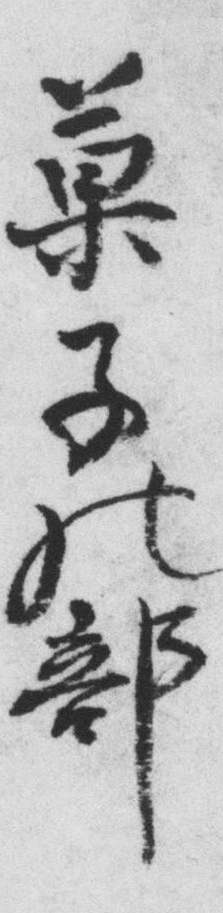菓子の部
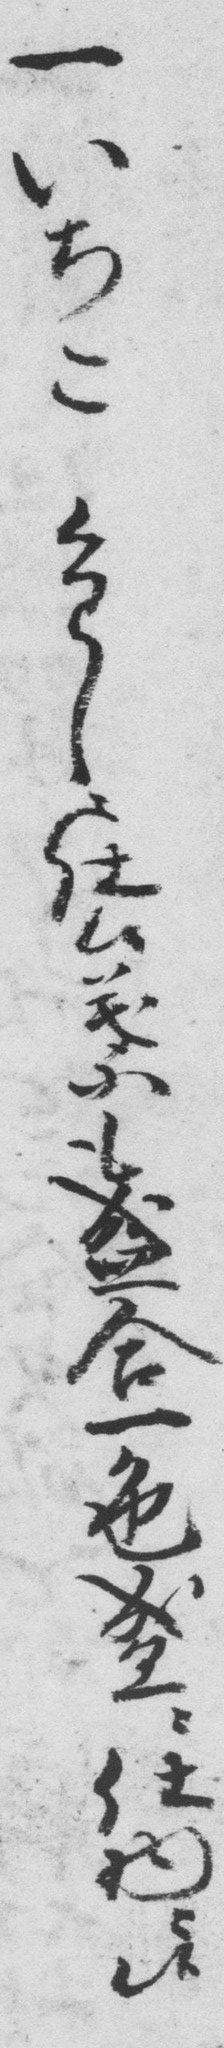一いちこくわしに仕候葉も盛合一色盛に仕物に候
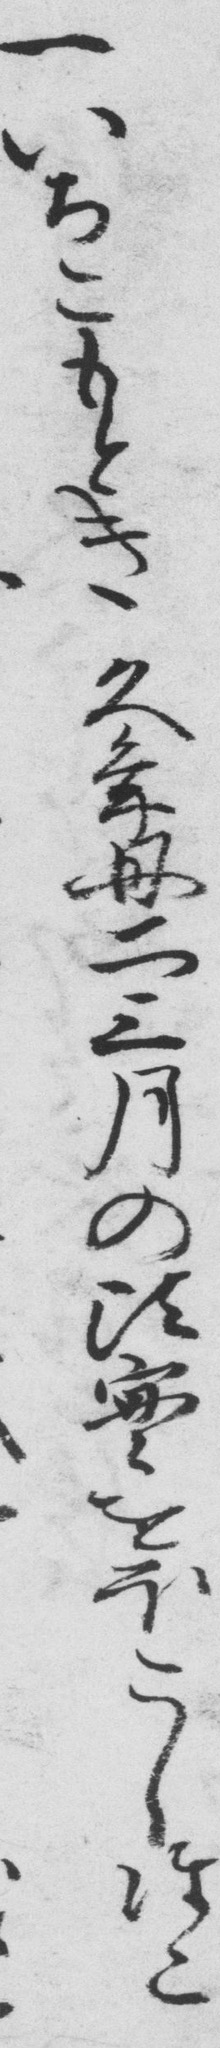一いちこもとき久年母二三月の頃実をほこしほこ
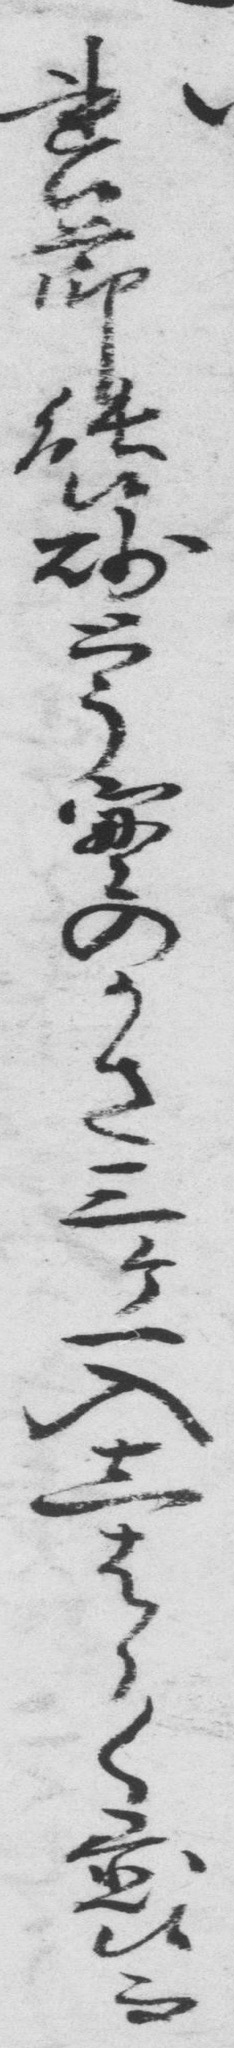れ候節能候砂とう実のかさ三ヶ一入しはらく置候て
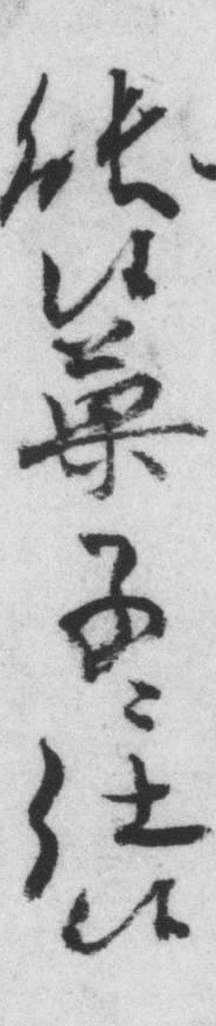能候菓子に仕候
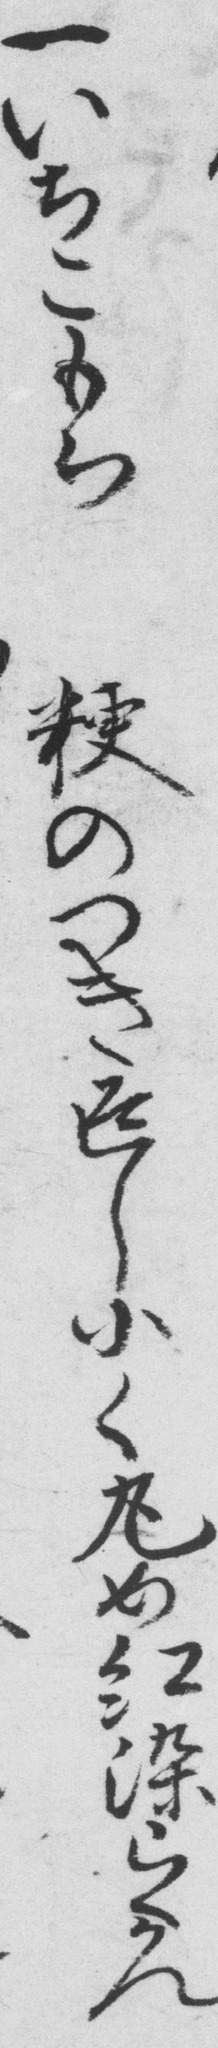一いちこもち粳のつき返し小く丸め紅染らくかん
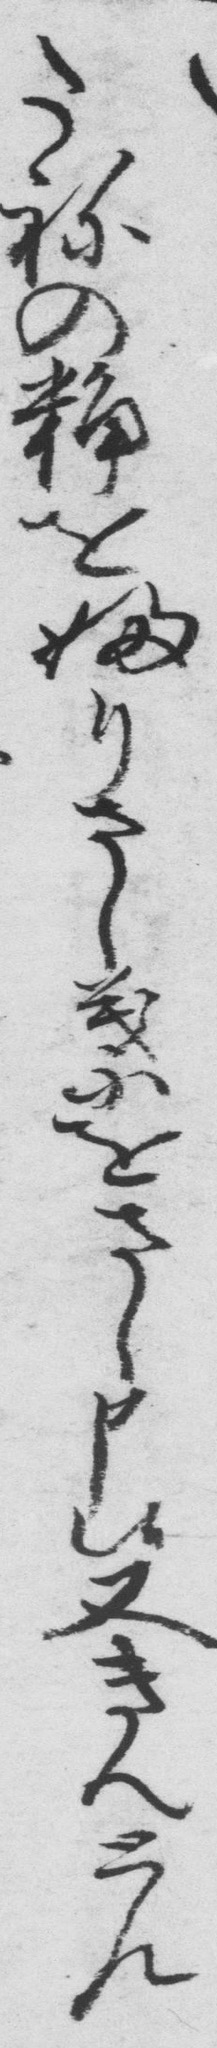たねの糒をふりさし葉をさし申候きんとん
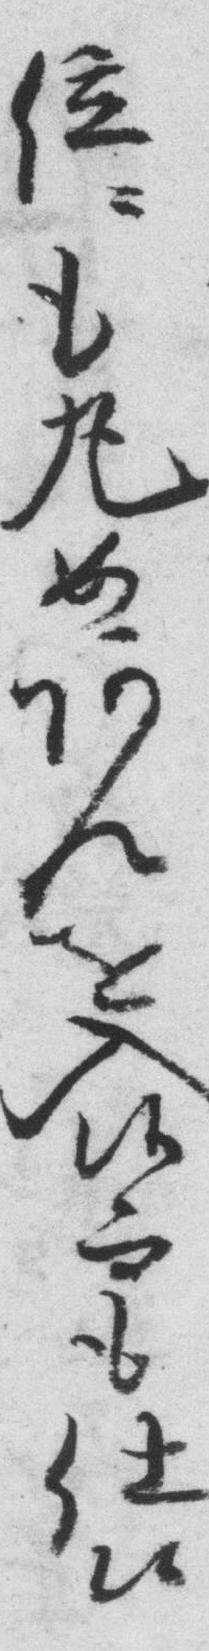位にも丸めあんを入候ても仕候
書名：料理集
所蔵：大阪府立大学学術情報センター 国文学研究資料館
